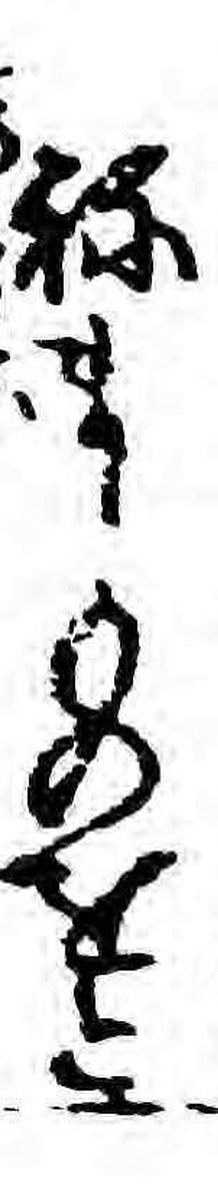ねましものをと
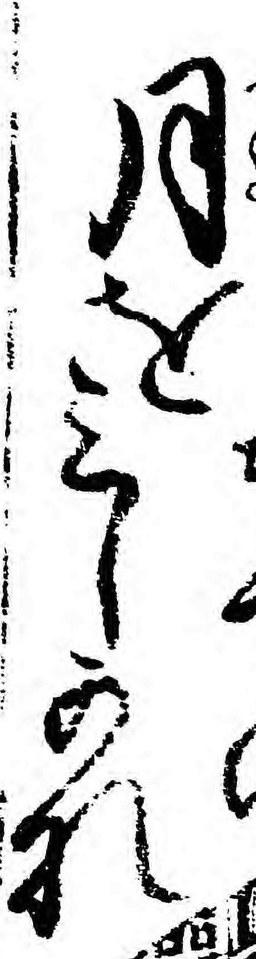月をみしかな

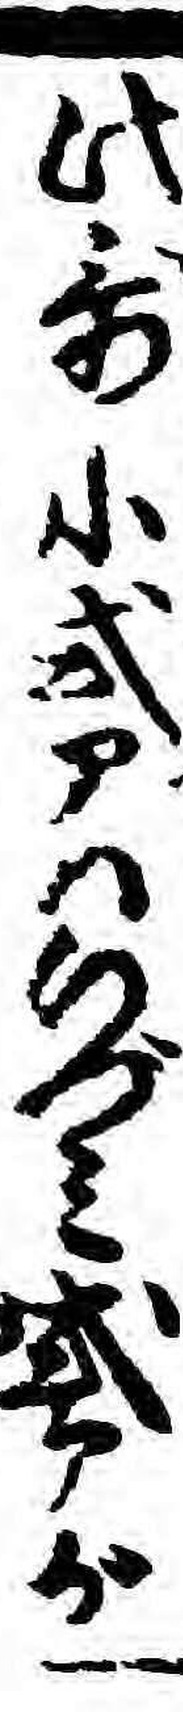此哥小式部あはいづみ式部が
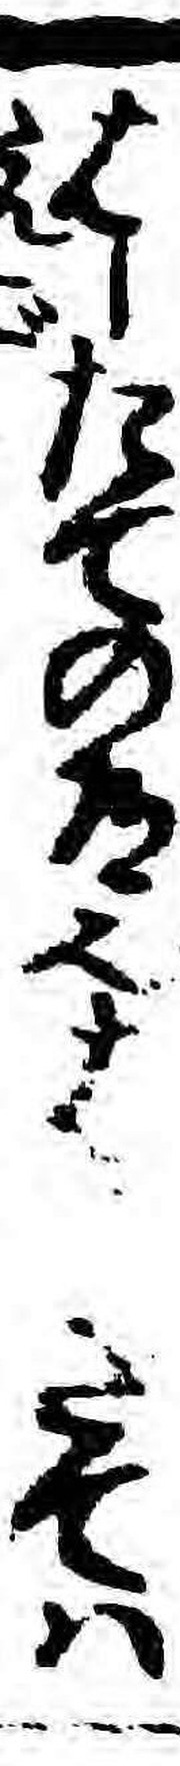はしだての道也はしだては
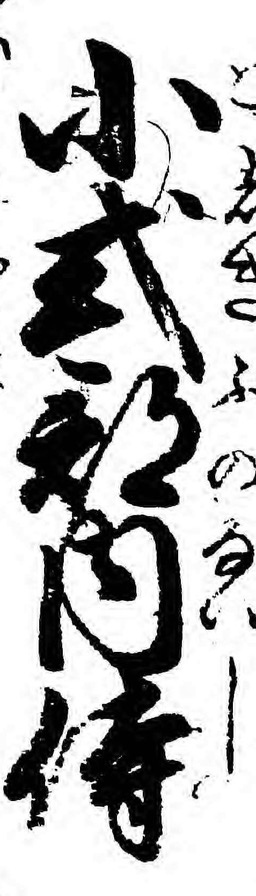小式部内侍
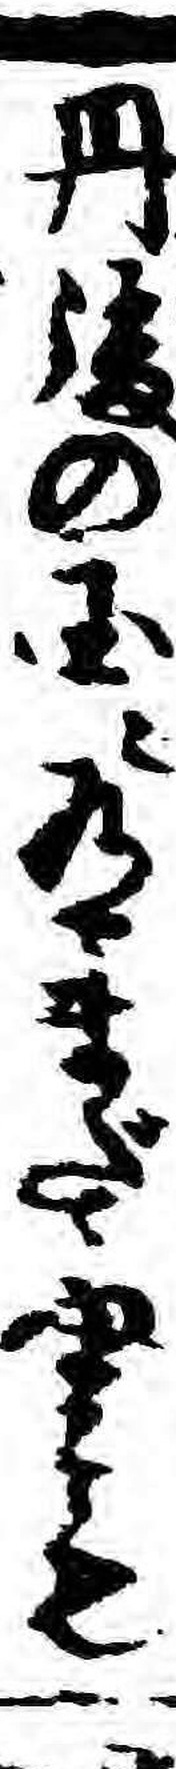丹後の国に有まだふみも
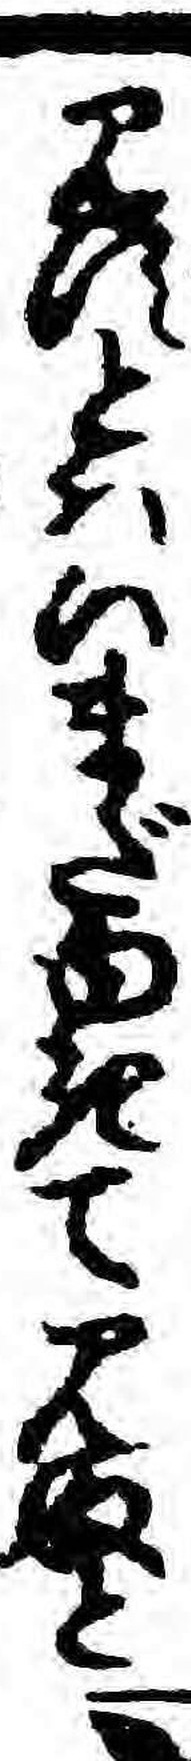見ずとはまだゆきて見ぬと
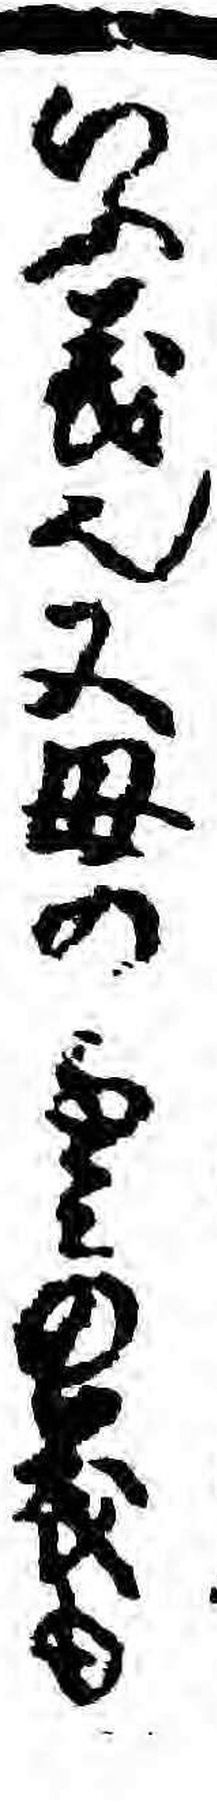いふ義也又母のふみの義も
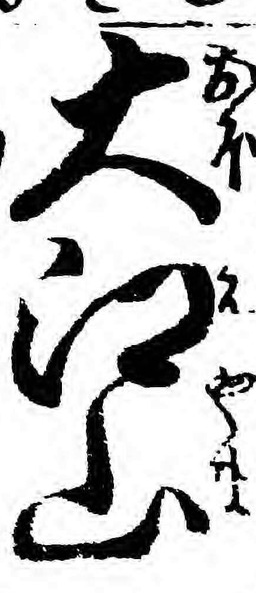大江山
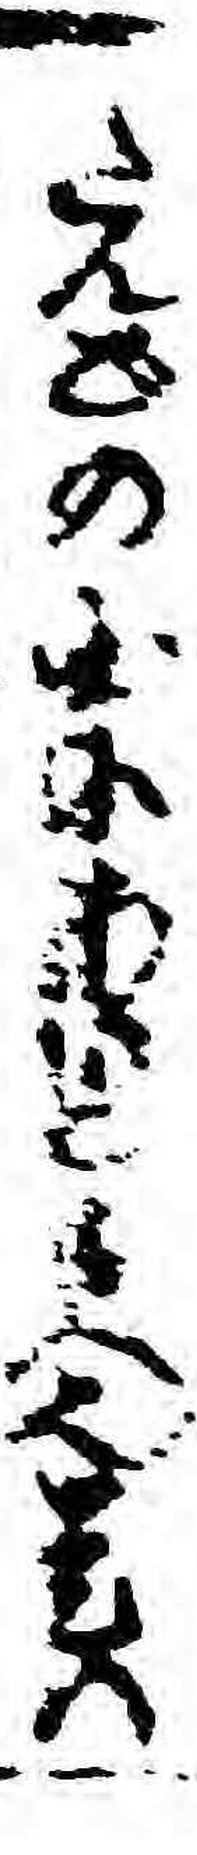たんごの国にありしゆへ也是は
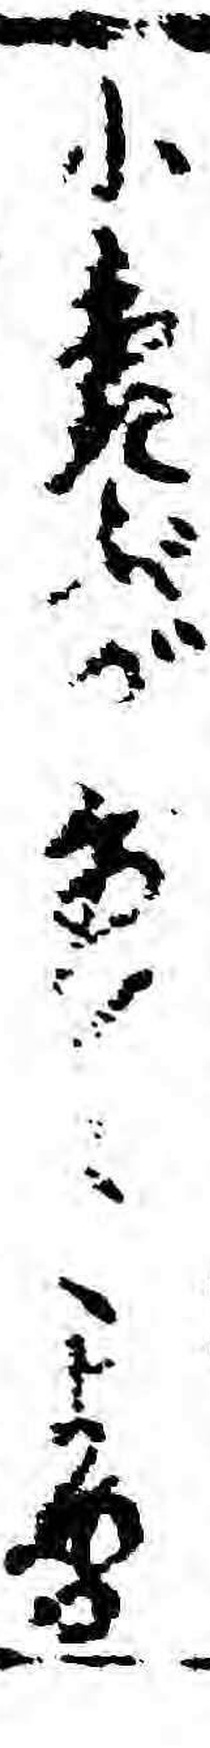小しきぶが哥をよくよめる
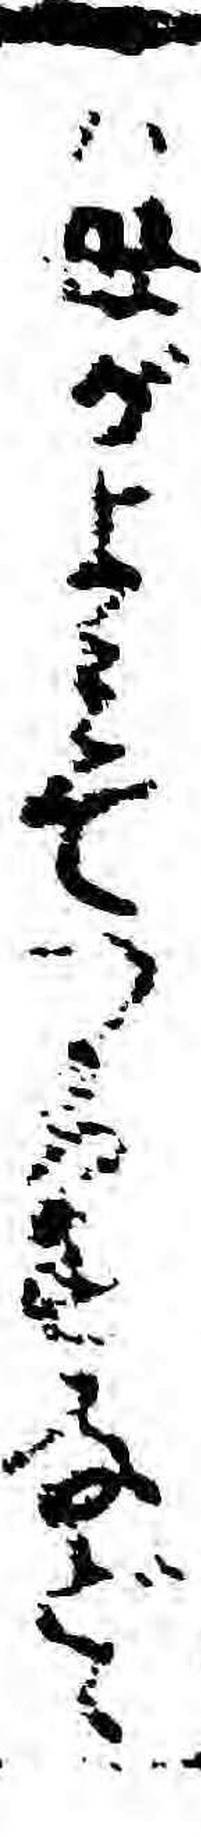は母がよみてつかはすなどゝ
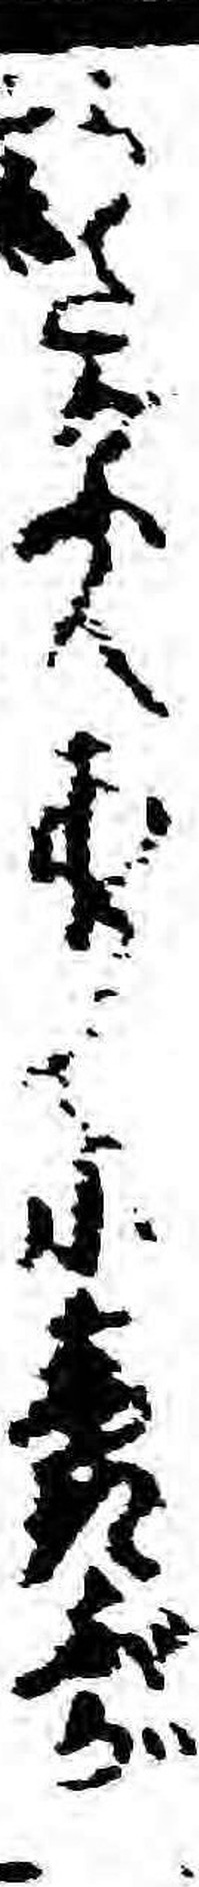うたがふ人ありて小しきぶが
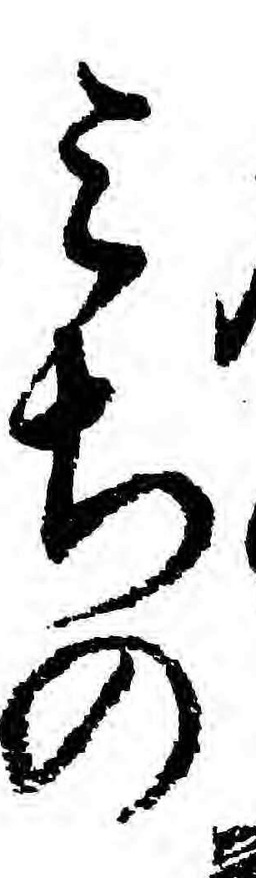みちの
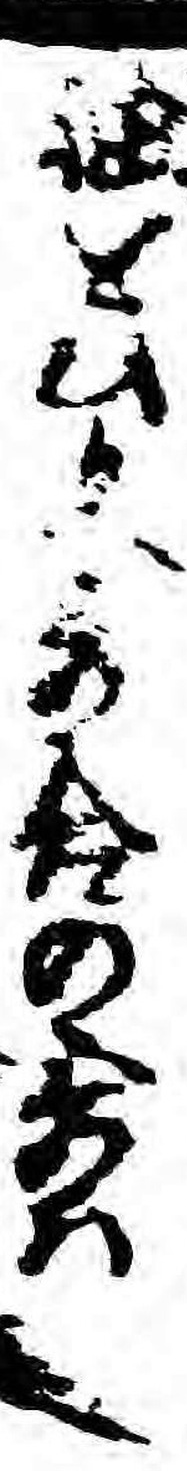袖をひかへ哥合も哥は
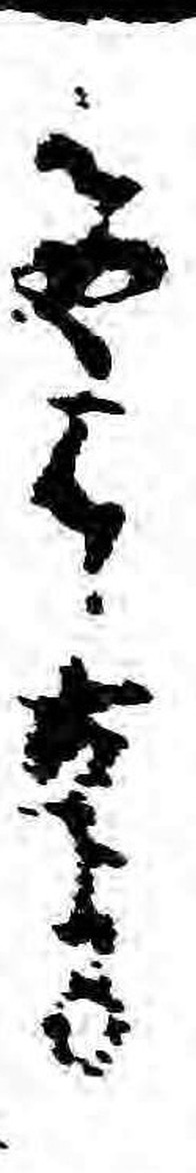はやはし立より
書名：頭書和歌注譯／壽賀多百人一首小倉錦
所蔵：国文学研究資料館
